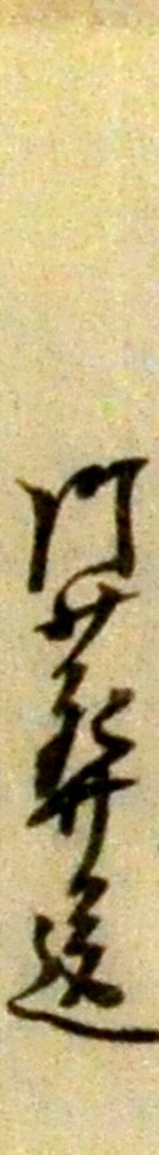御葬送
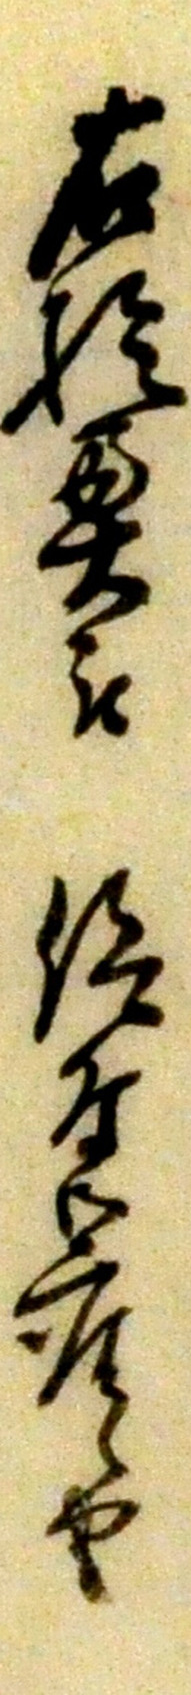右於奥被仰付御座候也
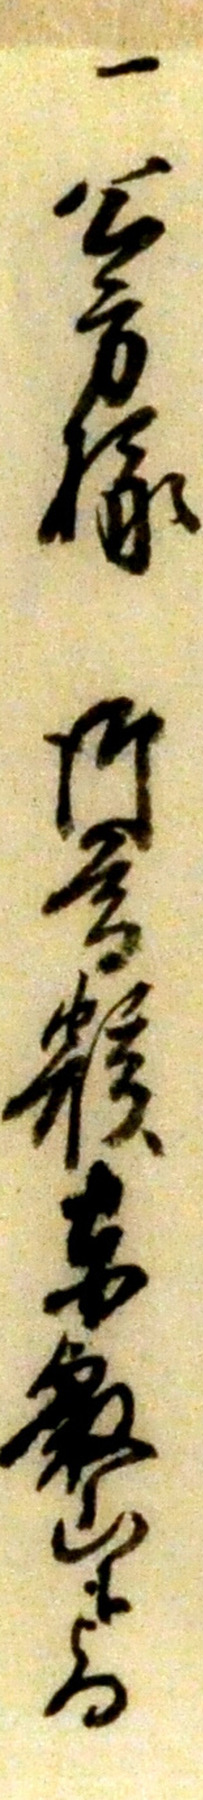一公方様御尊骸東叡山江被為
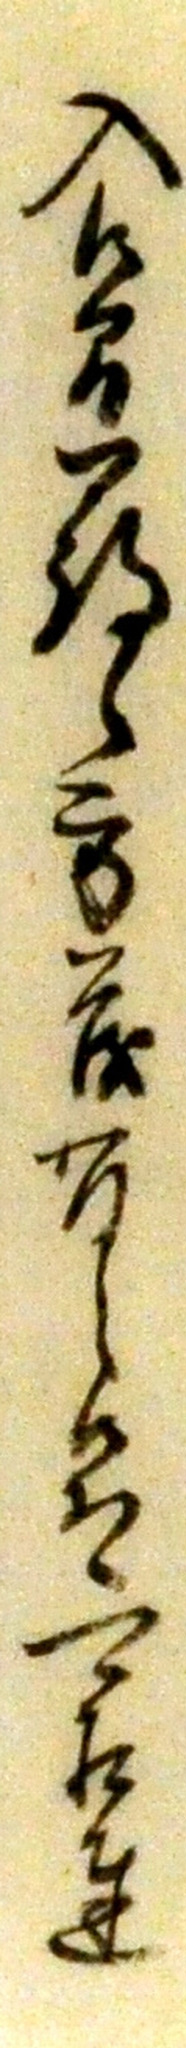入候間尋候方茂有之候ハヽ可相達
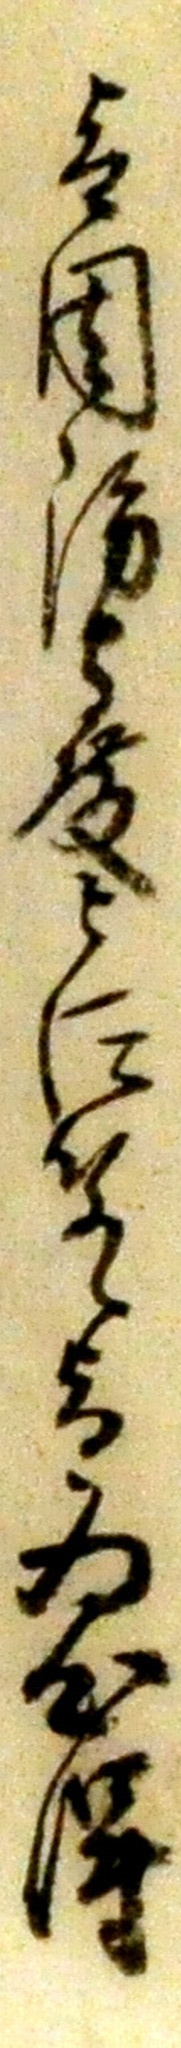旨周防守殿被仰聞候旨為心得
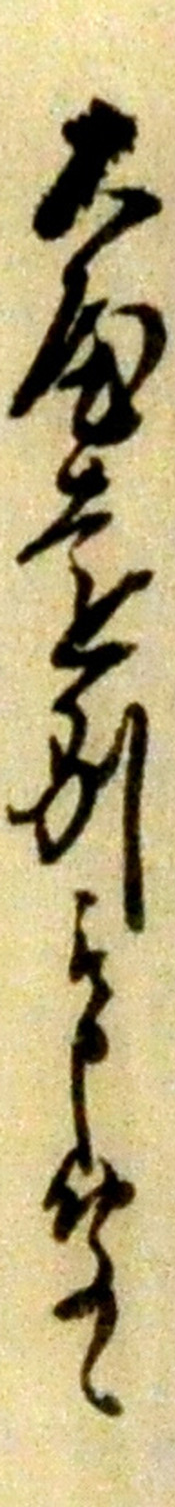大屋遠州江申聞候
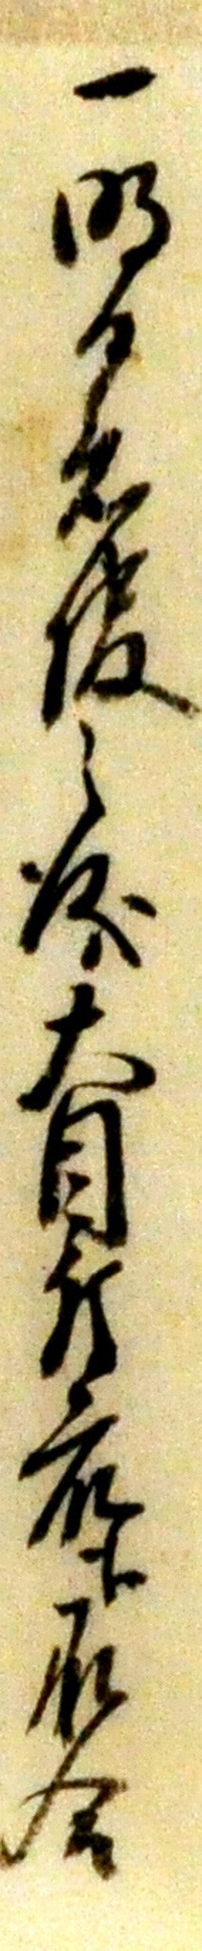一明日着服之儀大目付衆江承合
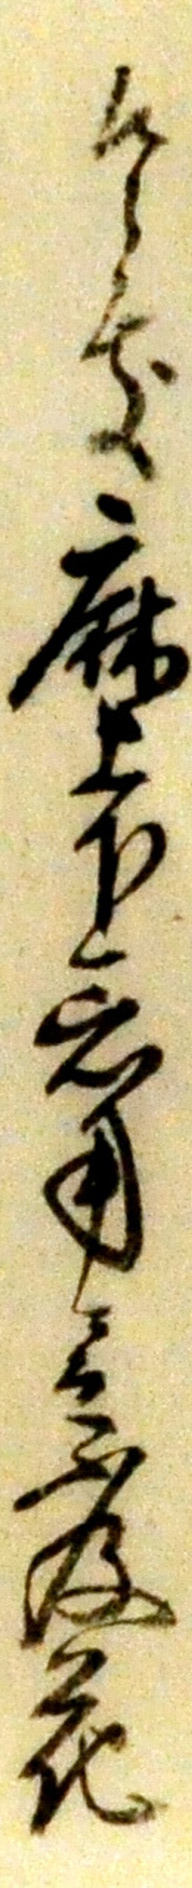候之処麻上下着用ニ而不及花
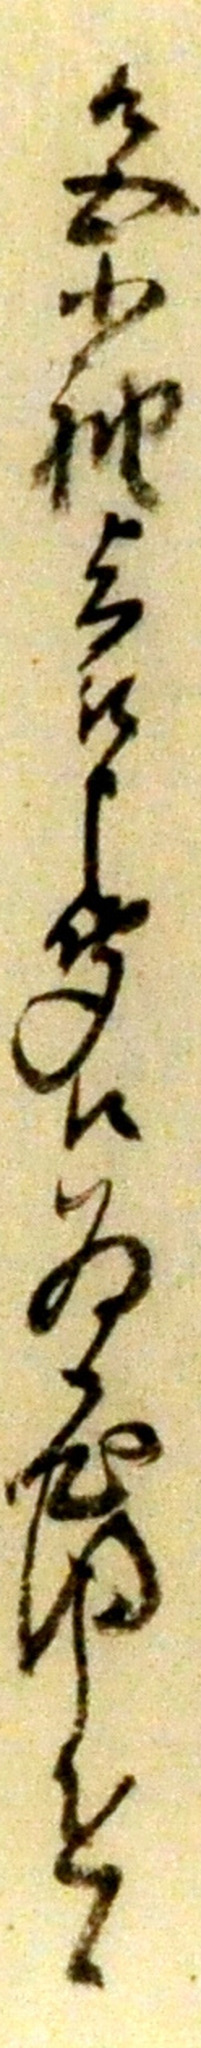色小袖旨被申聞候為心得申上候
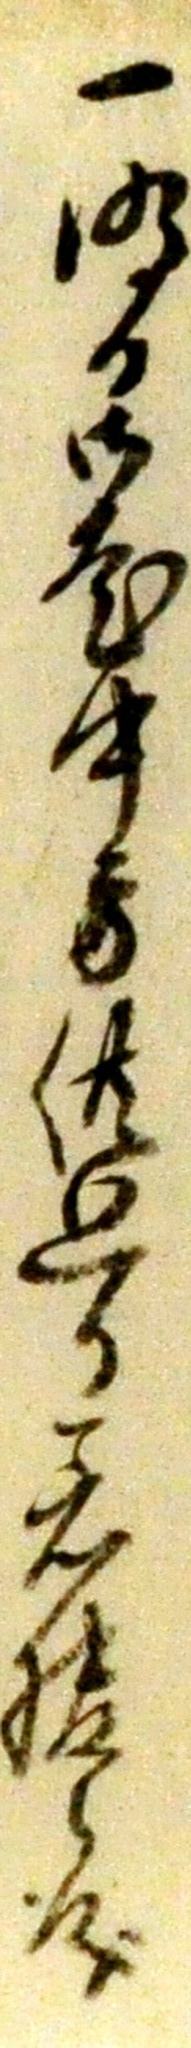一明日御老中方供廻り着服候儀
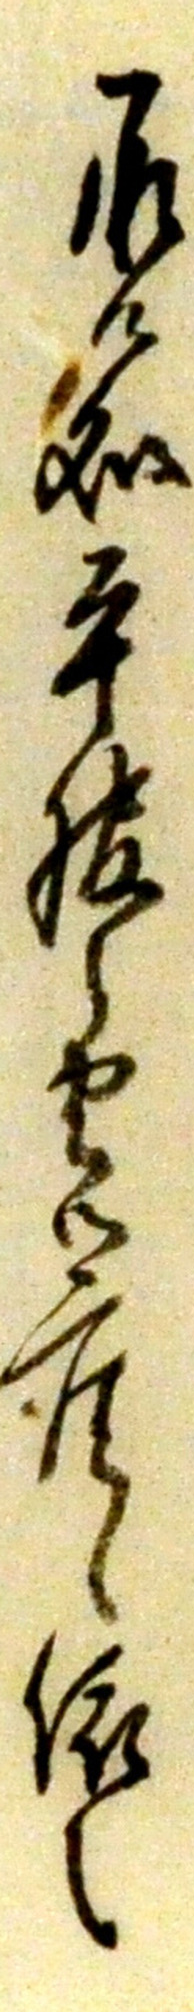承候処平服之由御座依之
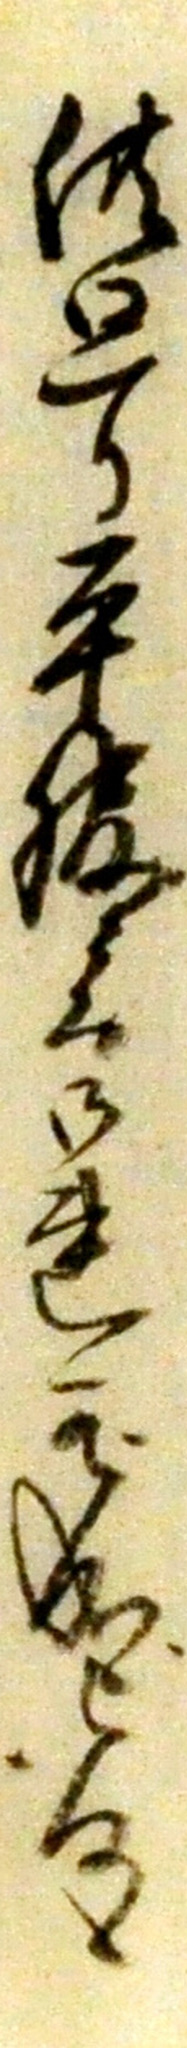供廻り平服ニ而御連可被成被存候
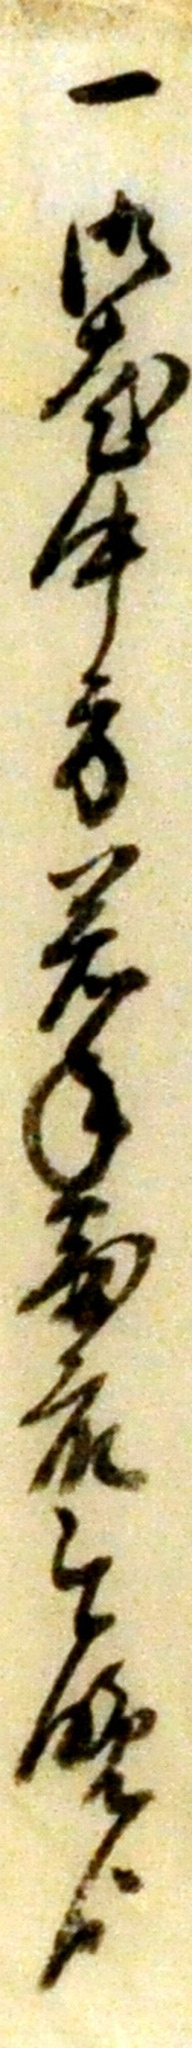一御老中方若年寄衆今晩ゟ
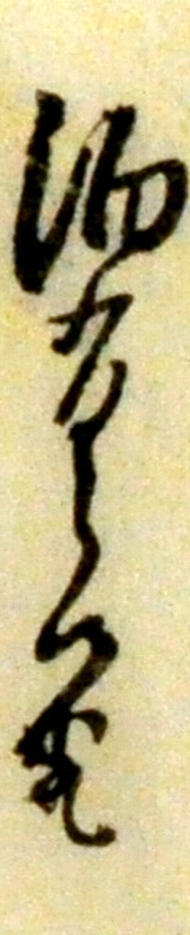泊有之候由
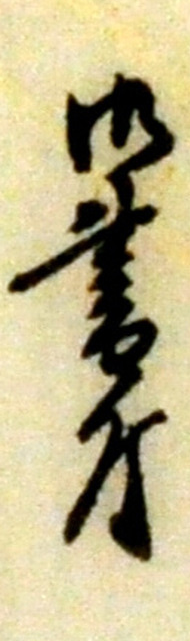御書付
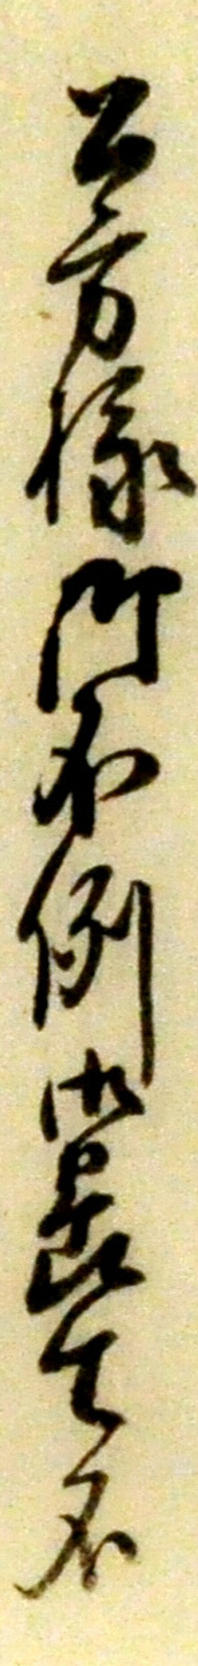公方様御不例御養生不
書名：書抜
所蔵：伊那市立高遠町図書館・合同会社AMANE
